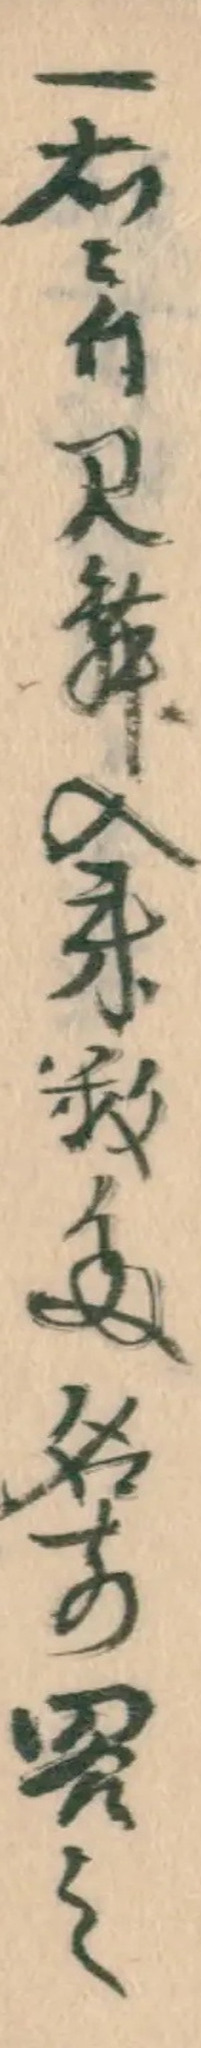一右ニ付見舞入来数多名前略之
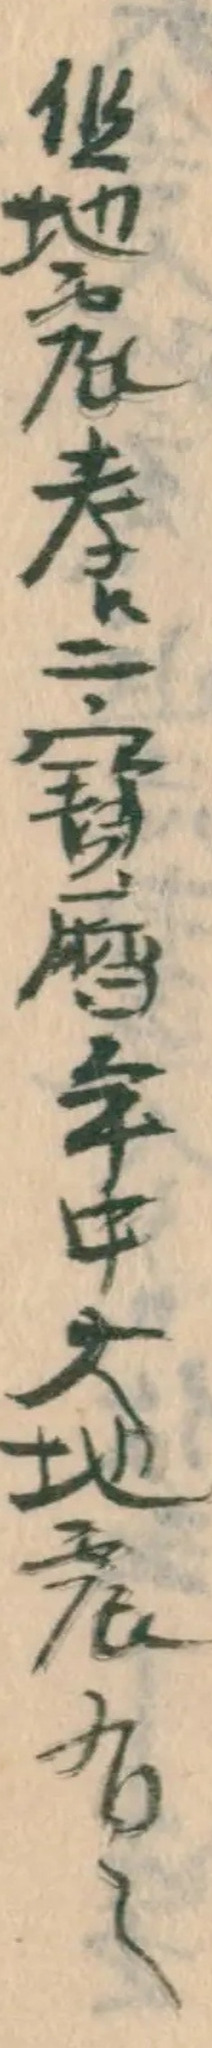但地震考ルニ宝暦年中大地震有之
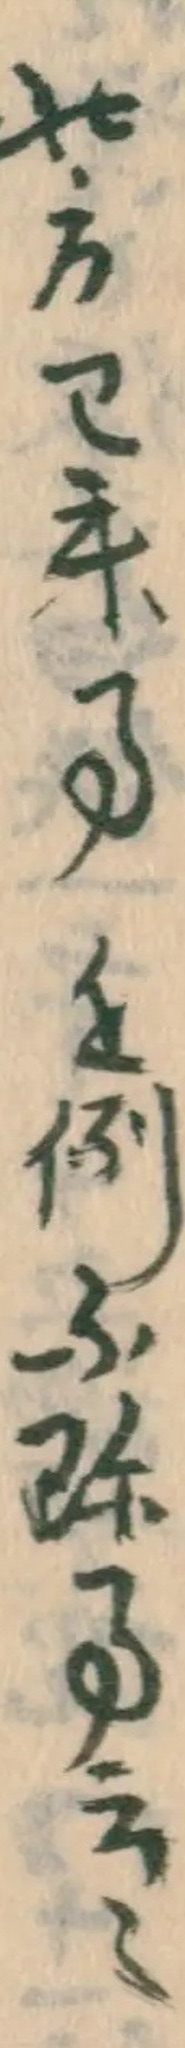此方巳年事跂近例不珍事云々
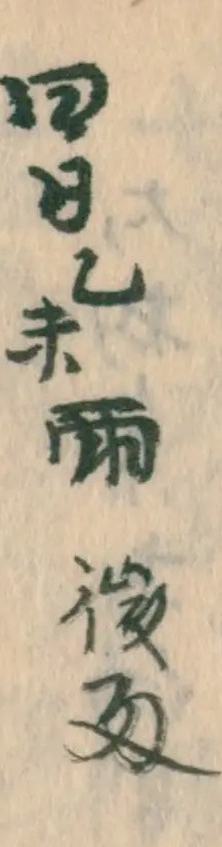四日乙未雨微雨
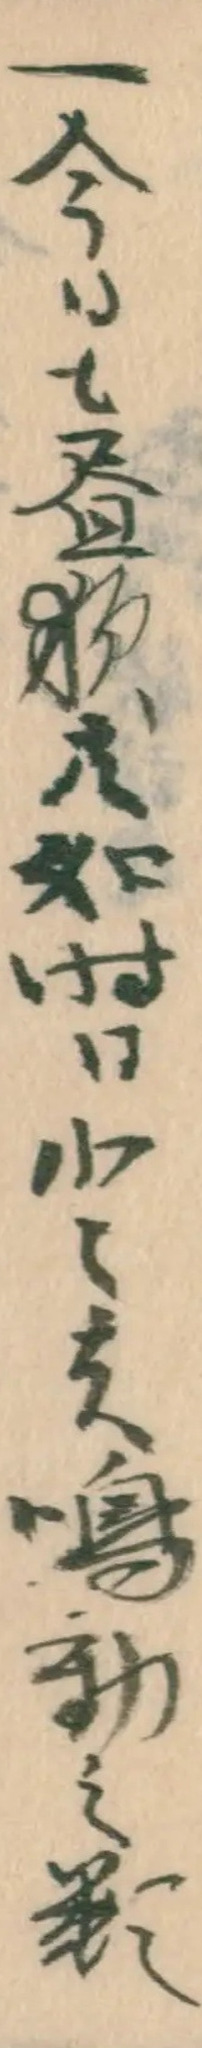一今日も昼夜共如時日少々は鳴動之類
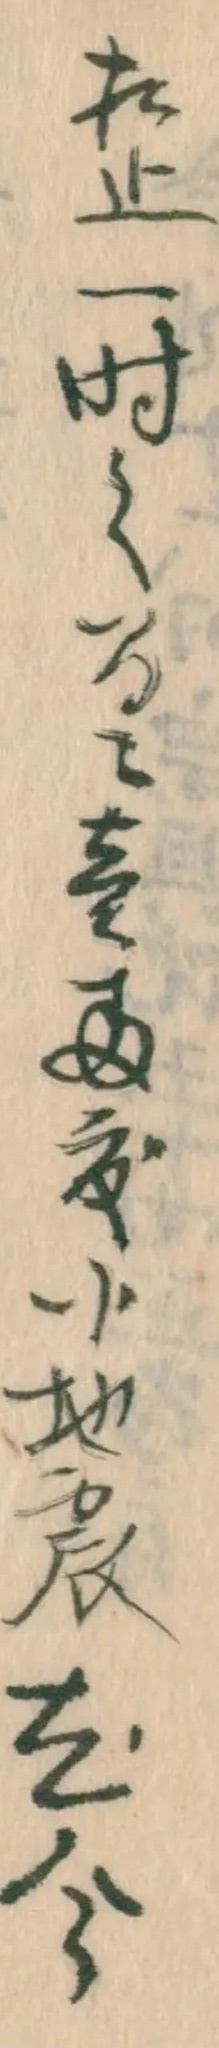相止一時之間ニ壱両度小地震尤今
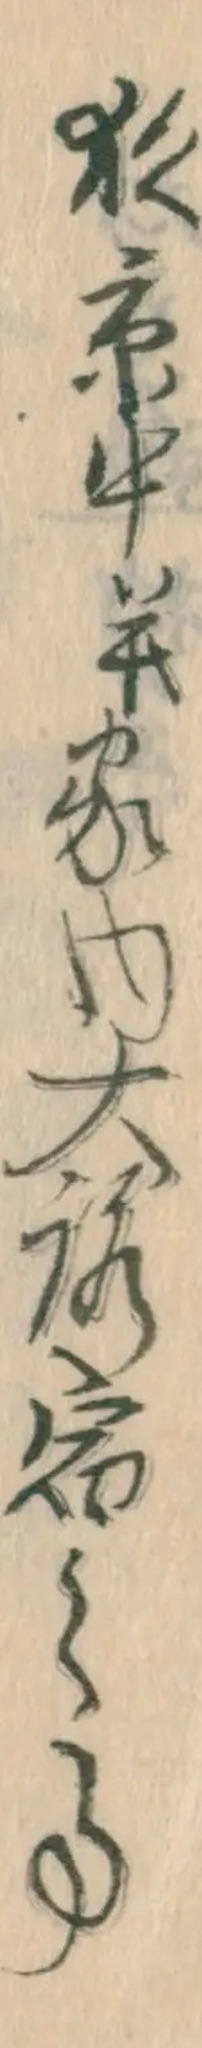夜京中并家内大路宿之事
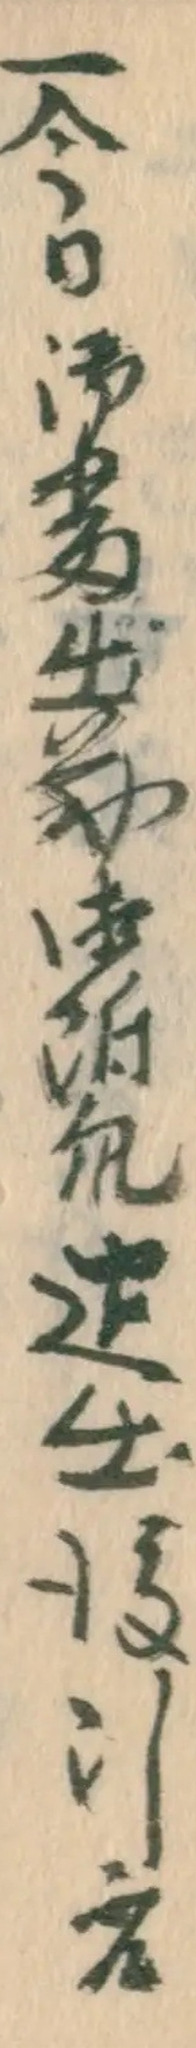一今日御番出勤御附衆退出後引取
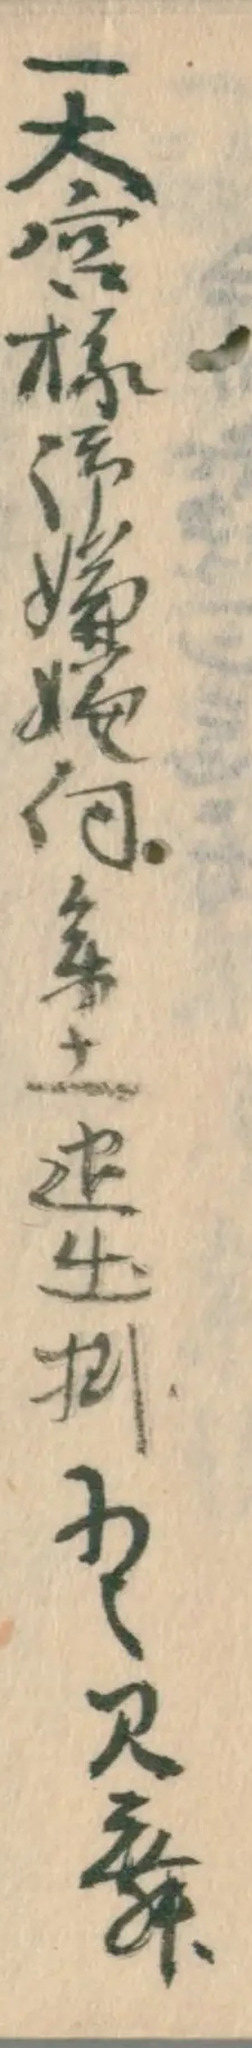一大宮様御機嫌伺参上退出掛少々見舞
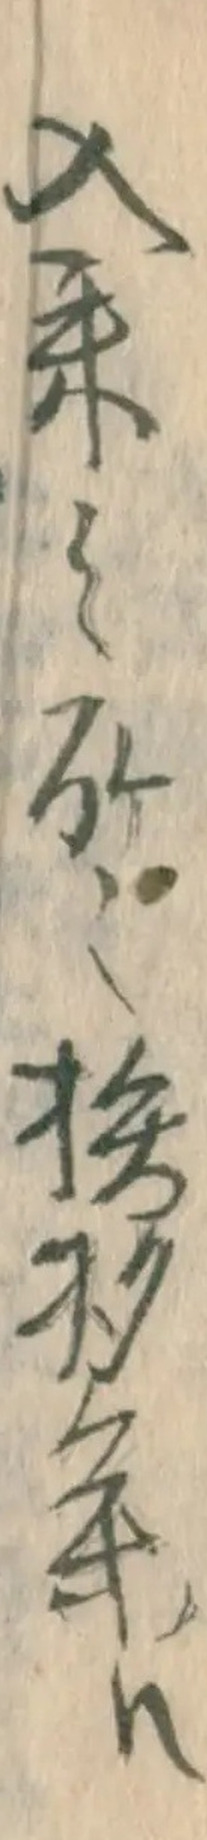入来之所々挨拶参ル

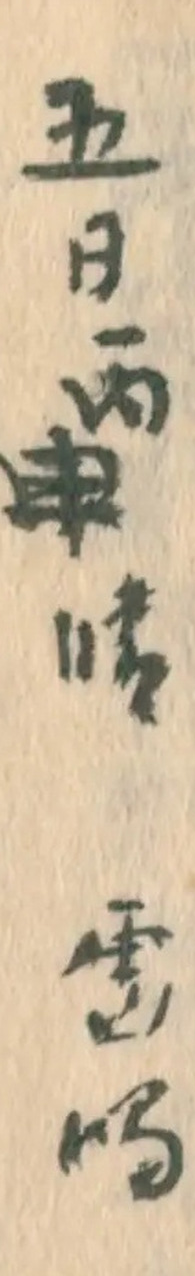五日丙申晴雷鳴
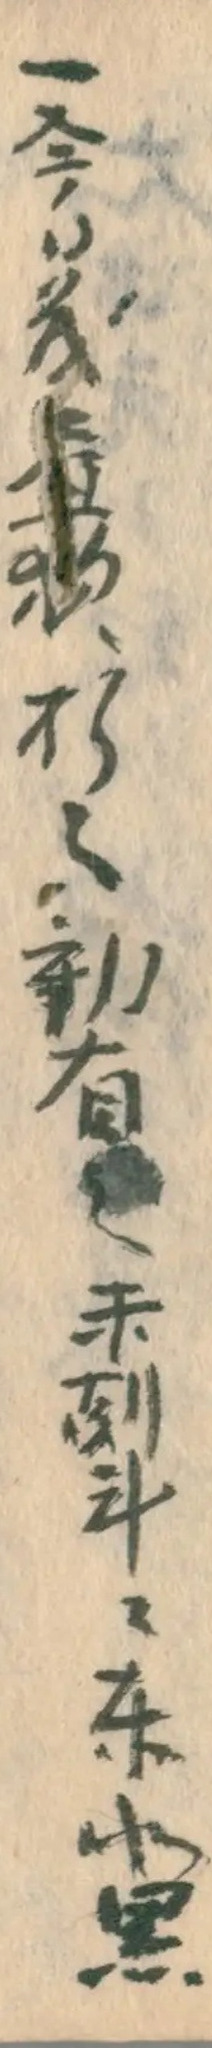一今日も昼夜折々動有之未刻計ニ東北黒
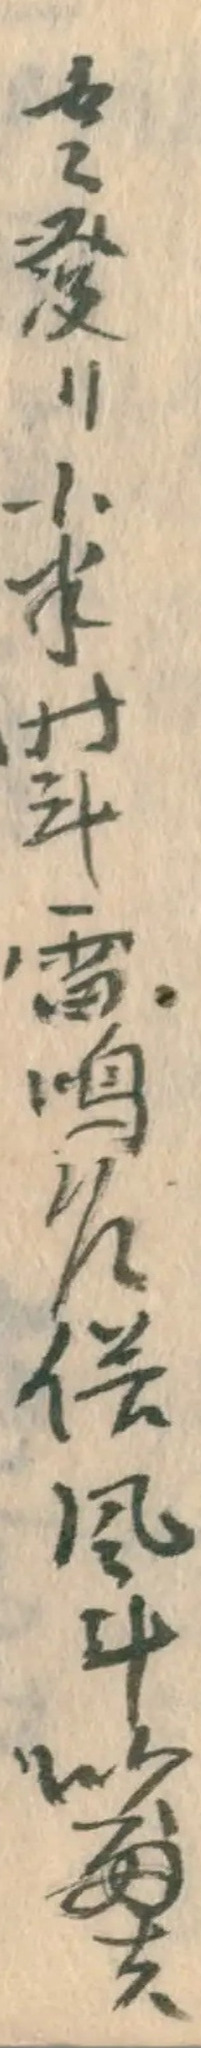雲発り小半時計雷鳴乍併風計吹雨は
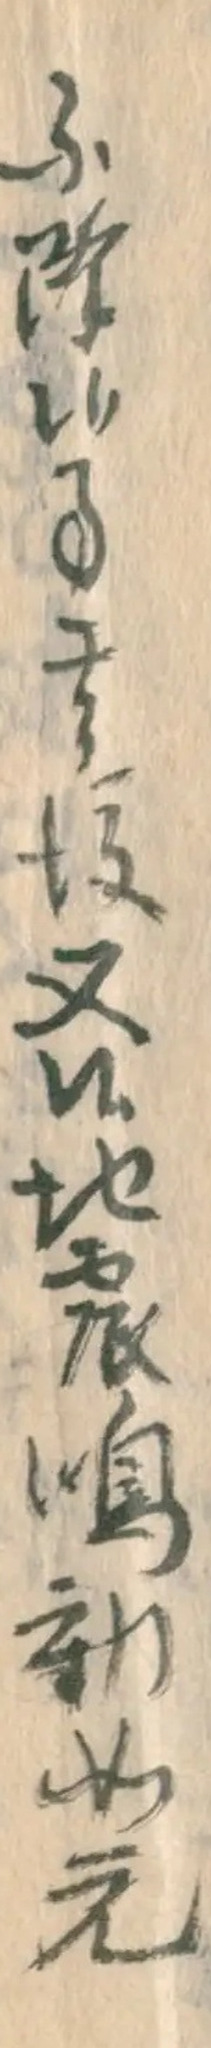不降候事其後又候地震鳴動如元
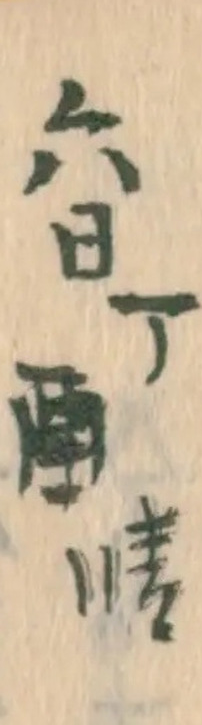六日丁酉晴
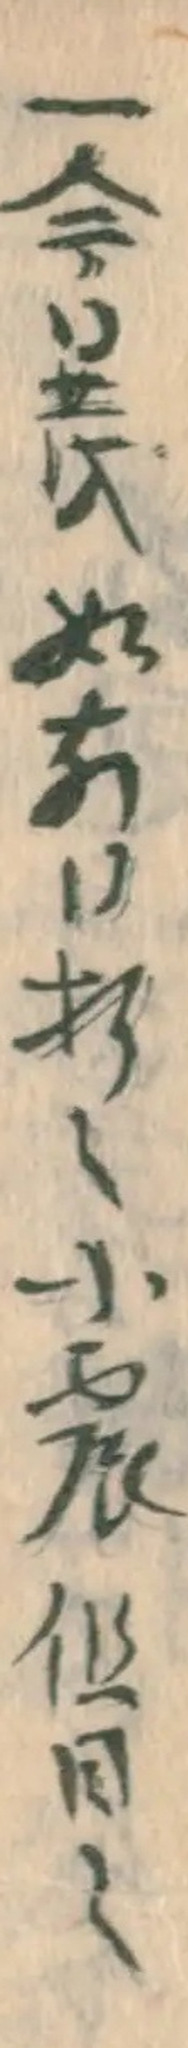一今日も如前日折々小震但日々
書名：禁裏御所御用日記. [131]
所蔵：国立国会図書館 National Diet Library, JAPAN
